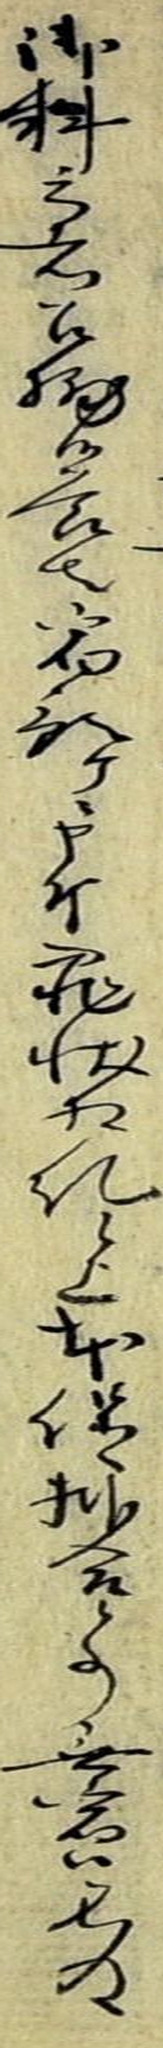一御科之者召捕候節は宿預ヶに申付罪状相糺候上本組へ掛合候事無宿は不及
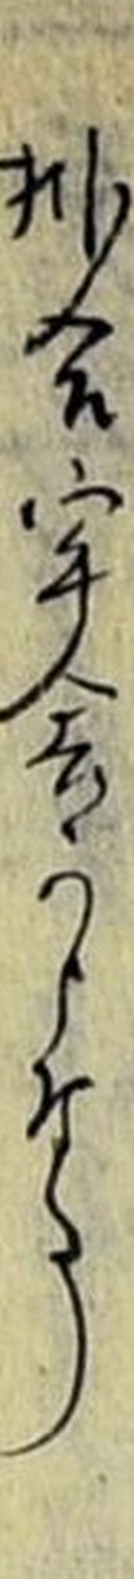掛合牢舎可申付事
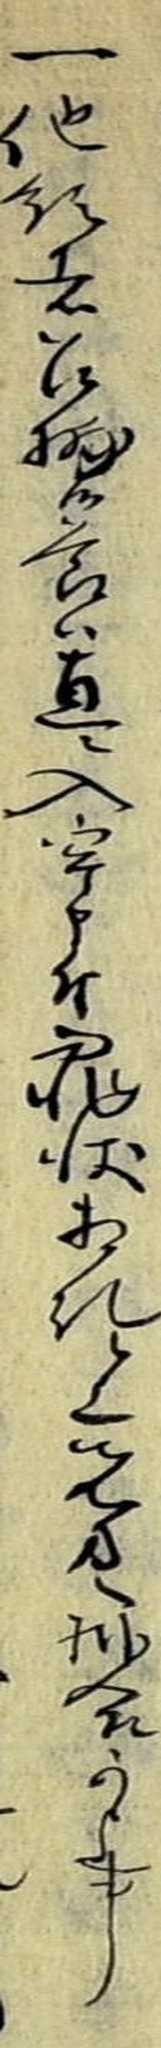一他領者召捕候節は直に入牢申付罪状相糺候上先方へ掛合可申事
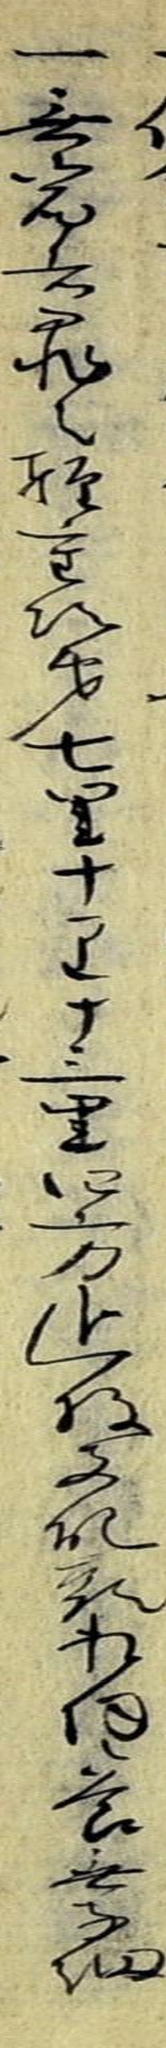一無宿者罪之軽重次第七里十里十三里四方追放支配頭相伺候節無子細
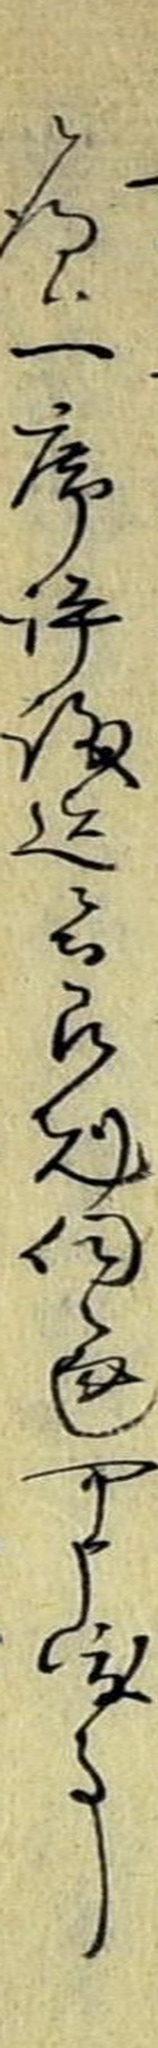候得は一席評議迄に而即刻伺之通可申渡事
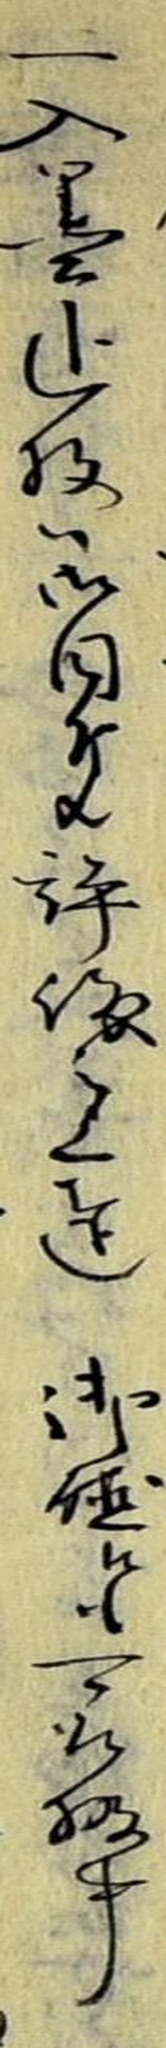一入墨追放は御目付共評議之上達御聴江も可取扱事
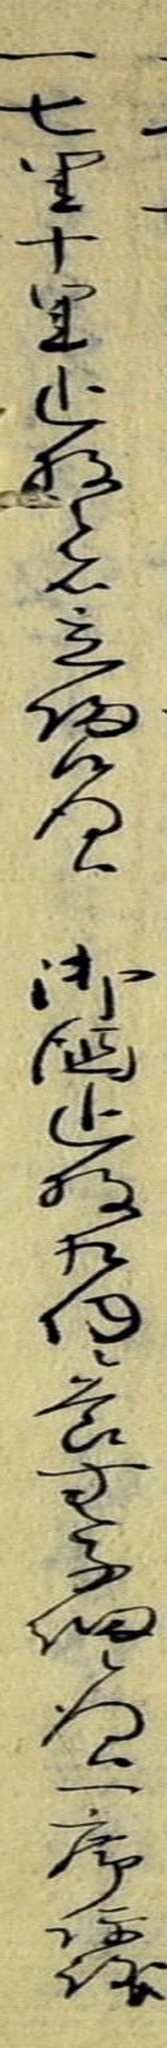一七里十里追放之者立帰候得は御国追放相伺候節無子細候得は一席評議

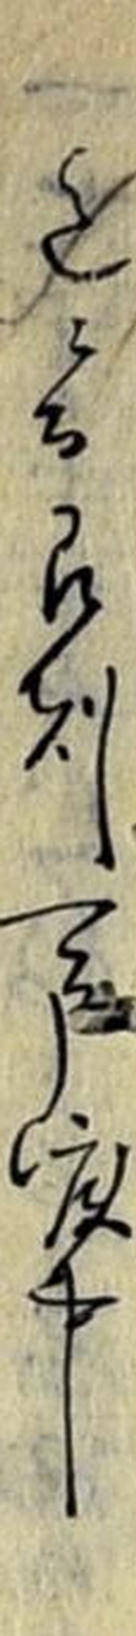迄に而即刻可申渡事
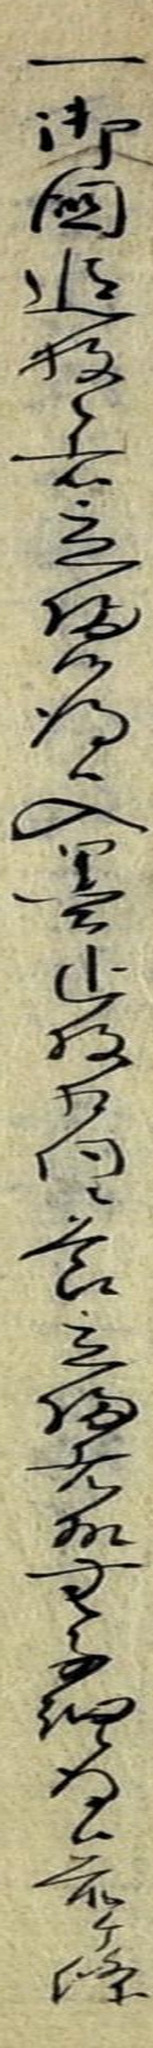一御国追放之者立帰候得は入墨追放相伺候節立帰者段無子細候得は前ヶ條
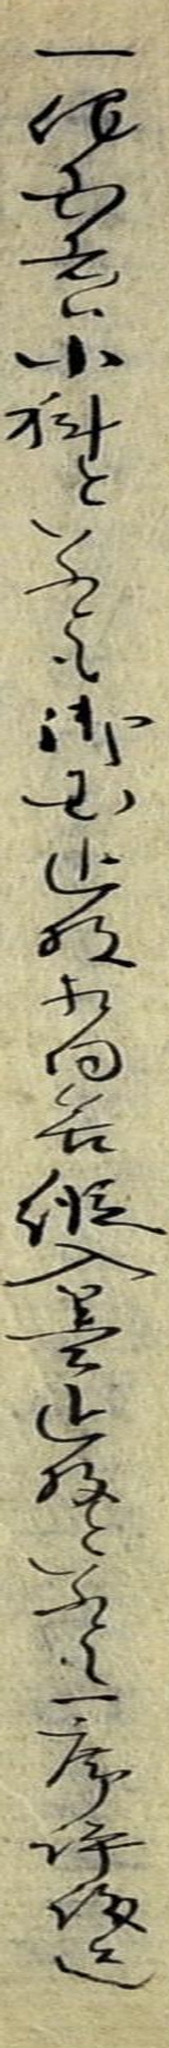一他国者は小科といふとも御国追放相伺候節縦入墨追放といふとも一席評議迄
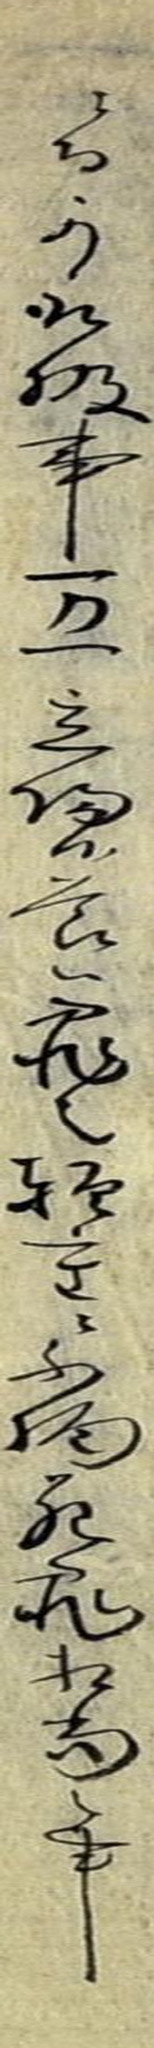に而可取扱事万一立帰候節は罪之軽重に不拘死罪相当之事
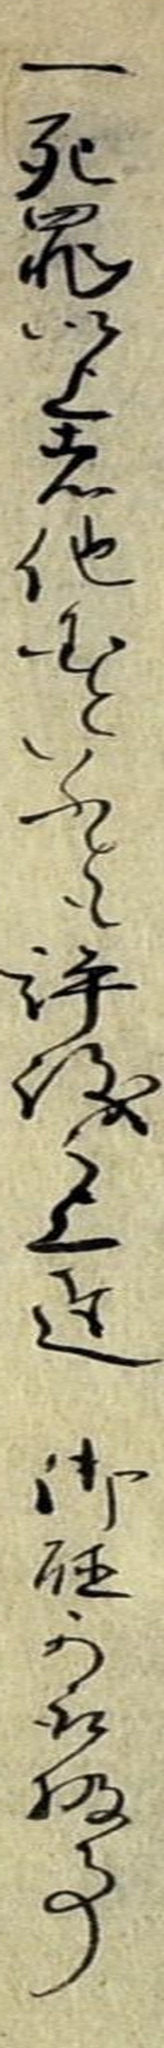一死罪以上は他国といふとも評議之上達御聴可被取扱事
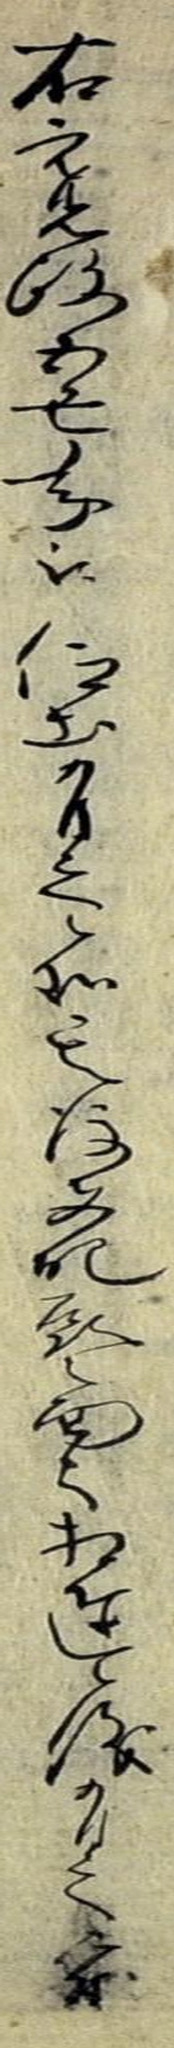右寛政五丑年被仰出有之候処其後支配頭之面々へ相達候儀有之に付
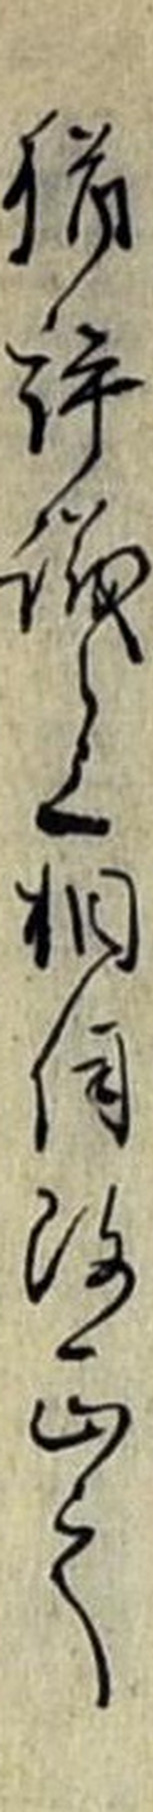猶評議之上相伺改正之
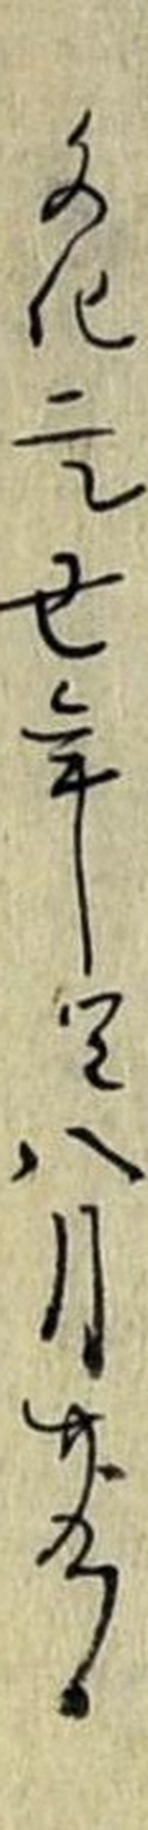文化二乙丑年閏八月廿九日
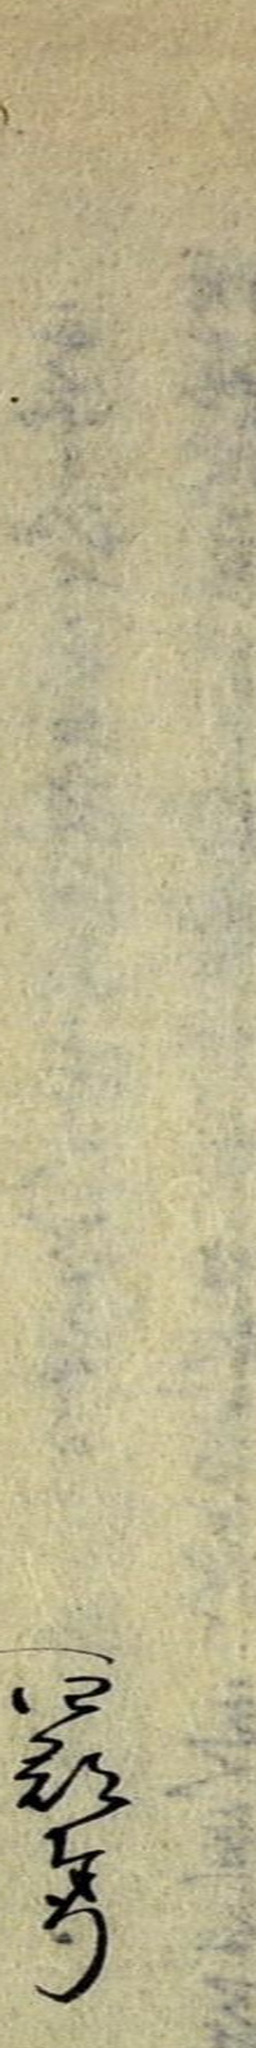四郡奉行
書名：命令之部 四
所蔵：福井県文書館 Fukui Prefectural Archives
